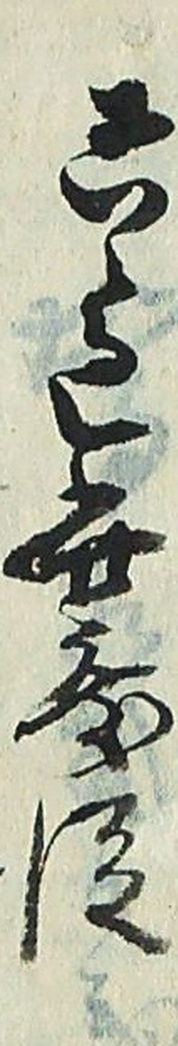右之通此度従
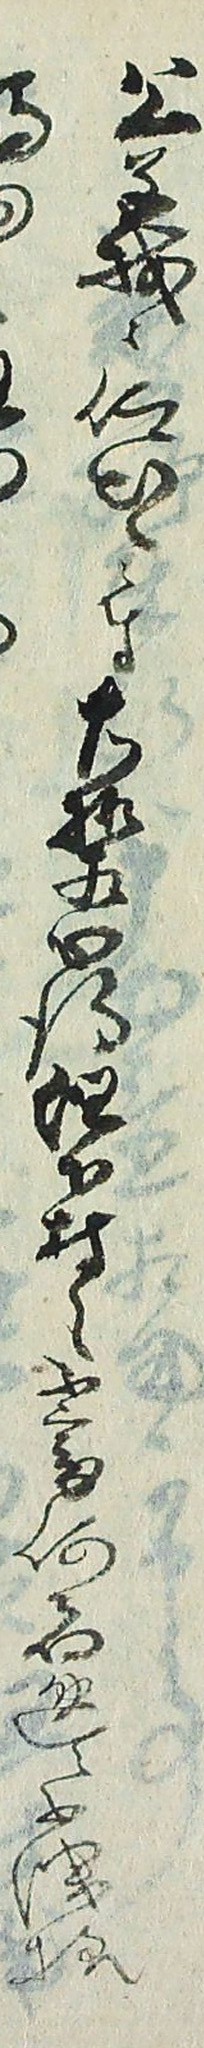公義被仰出候に付右様相心得組下村々不寄何者逸々不洩様
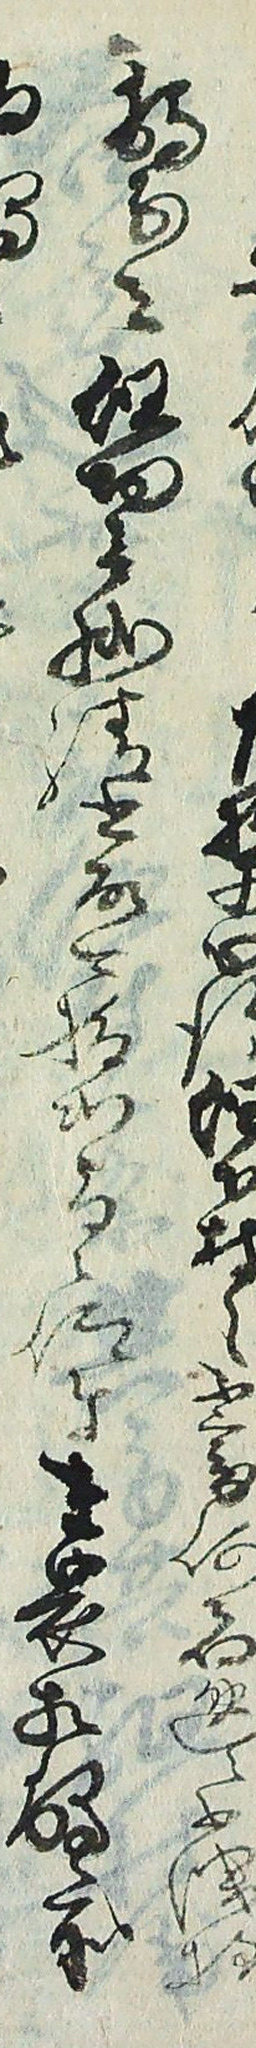触知せ組切壱紙請書取可指出旨被仰付奉畏相触候所
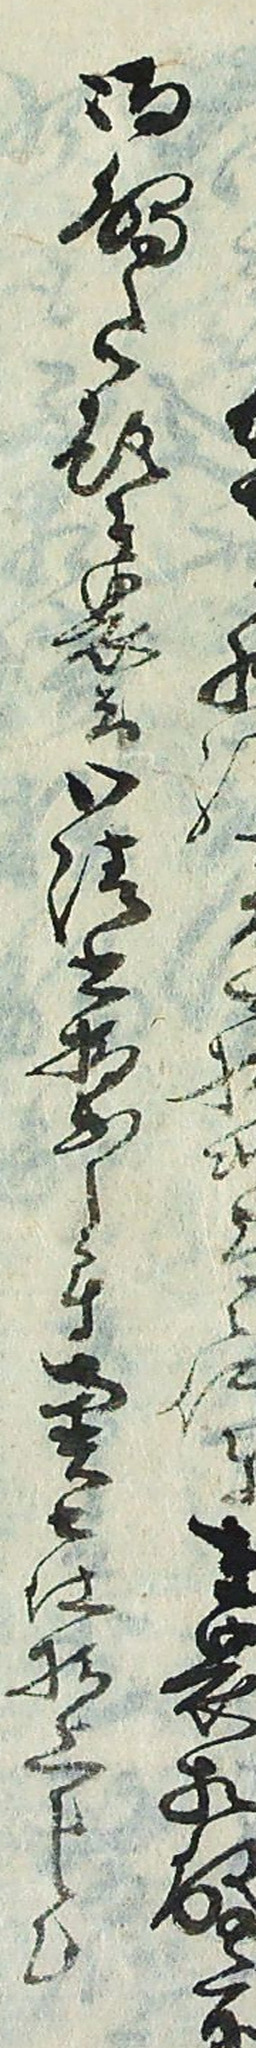御触之御趣奉畏旨御請書指出候に付奥書仕指上申候以上
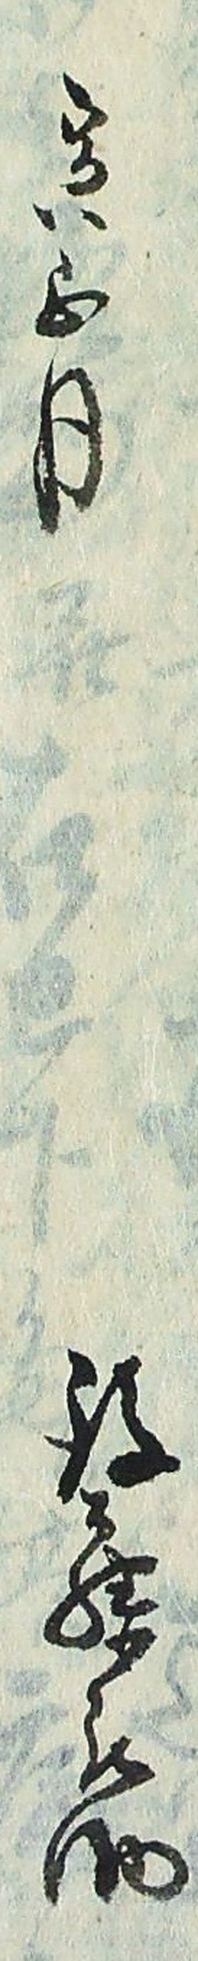寅正月後藤庄助
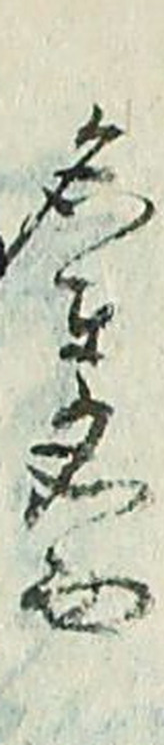名東名西
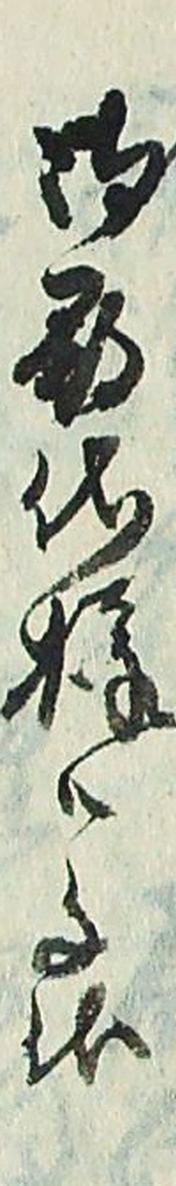御郡代様御手代
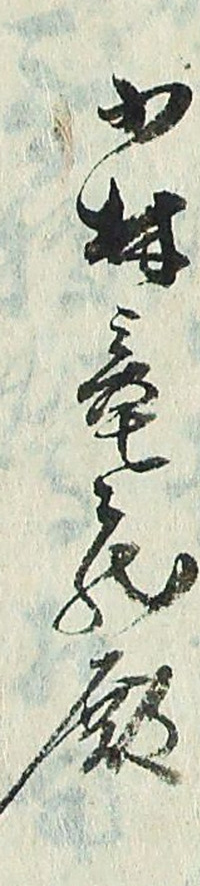小林竜蔵殿

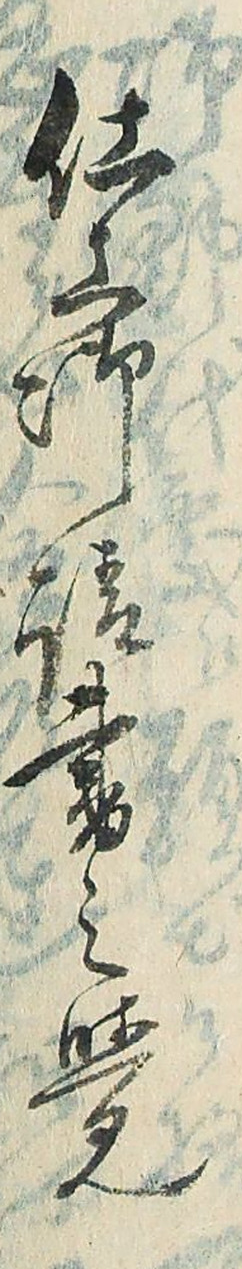仕上御請書之覚
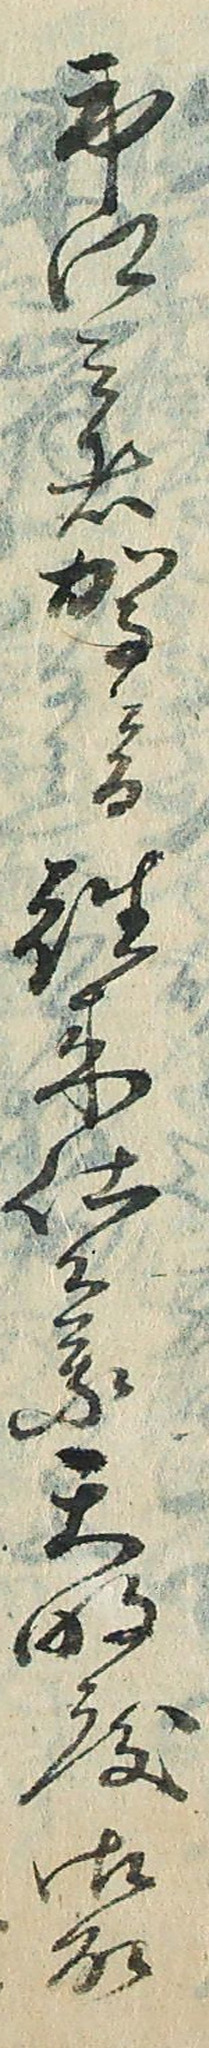市郷之者駕に而往来仕候義天明度御取
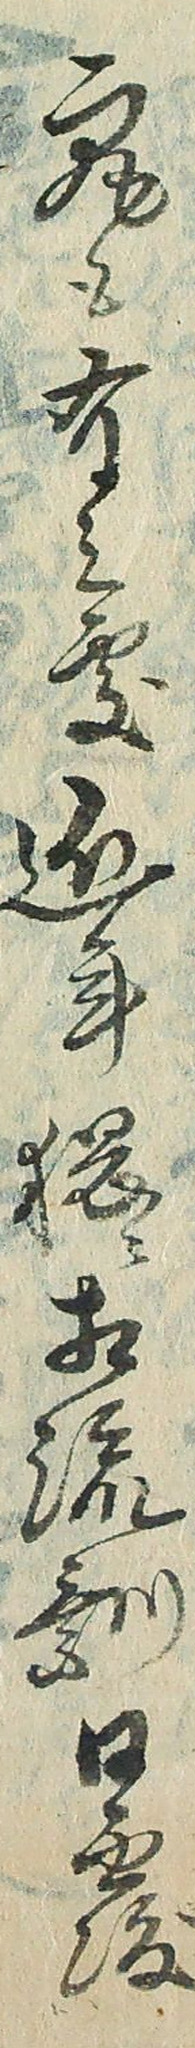究も有之処近年猥に相流剰日覆
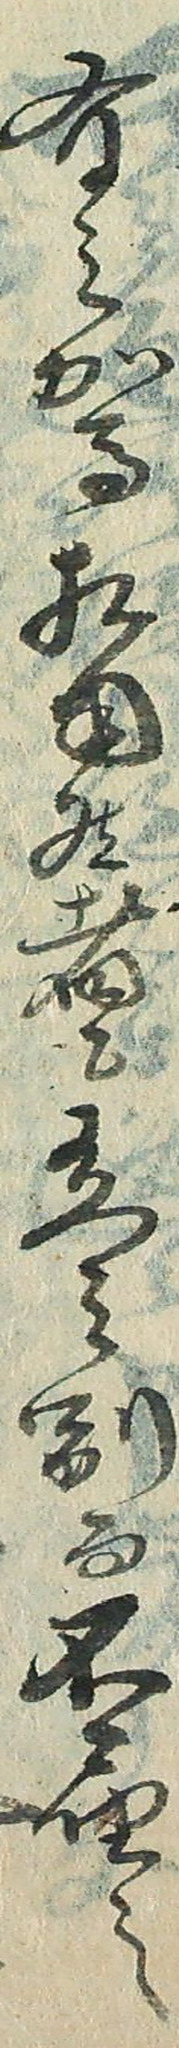有之駕相用候者も有之別而不届之
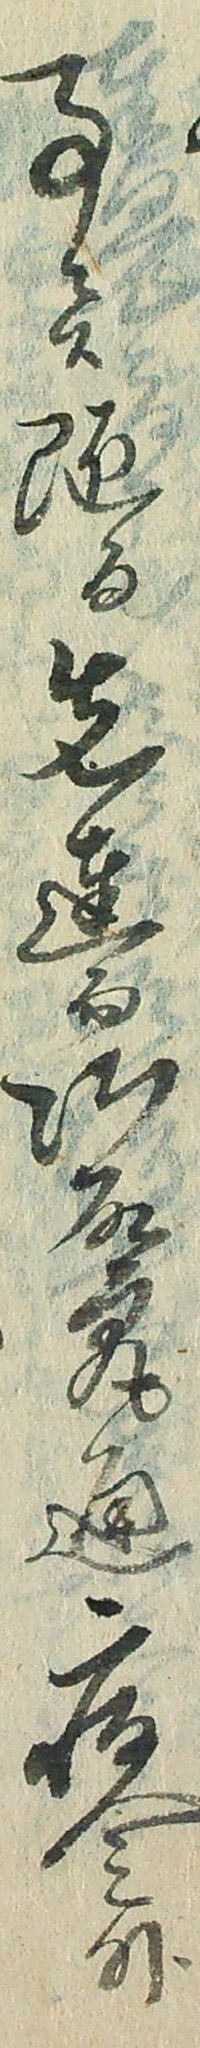事に候随而先達而御取究通病人之外
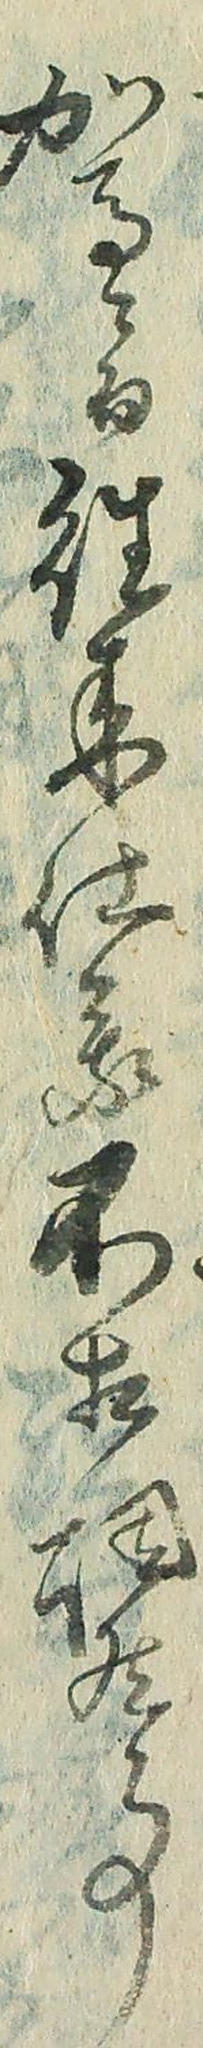駕に而往来仕義不相調候事
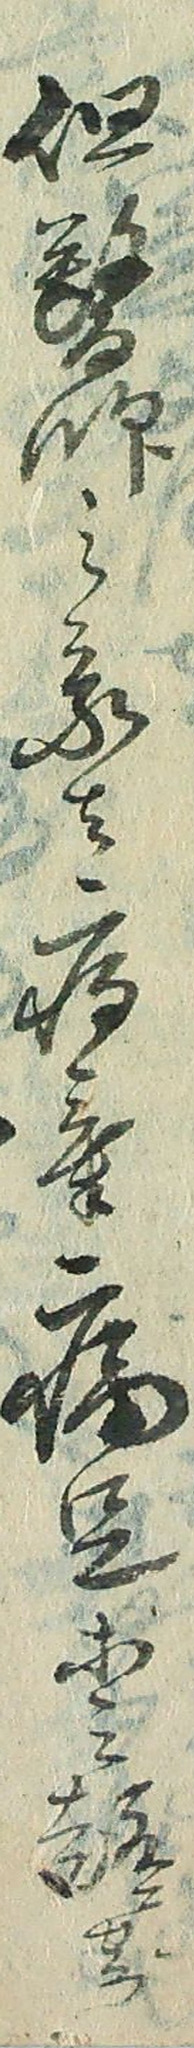但医師之義は病気痛足等之趣に寄
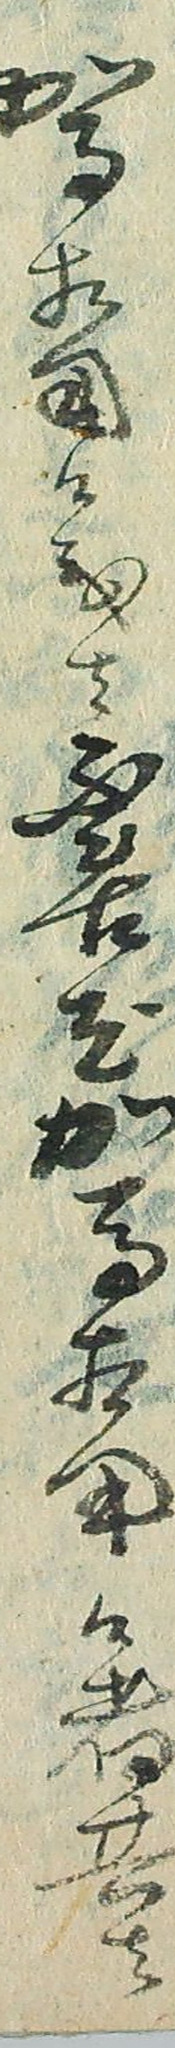駕相用候義は不苦尤駕相用候者共は
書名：諸御用御□受書控
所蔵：鳴門教育大学 Naruto University of Education
